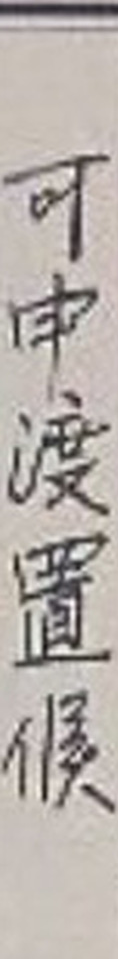可申渡置候
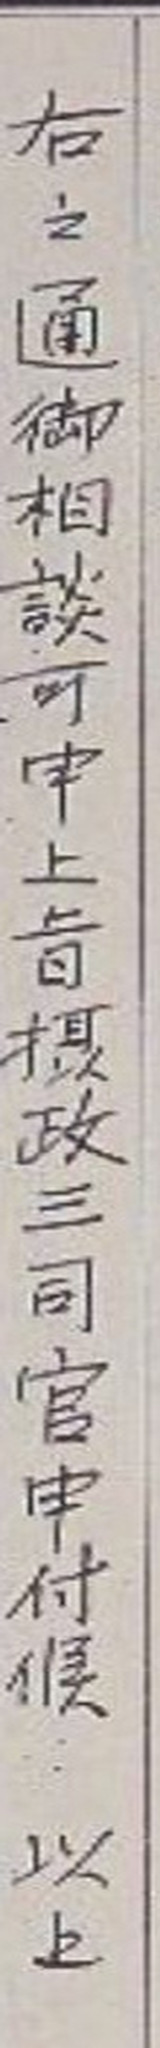右之通御相談可申上旨摂政三司官申付候以上
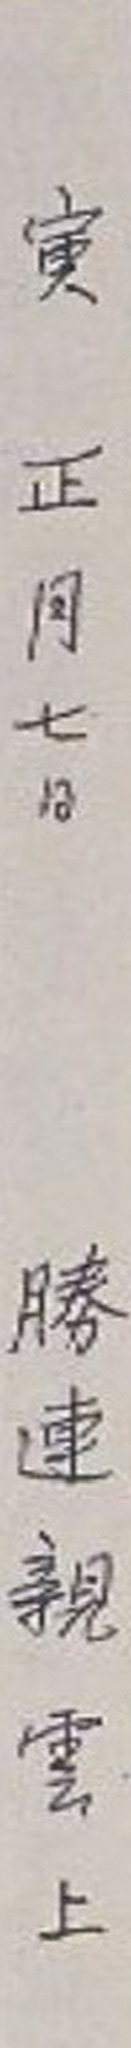寅正月七日勝連親雲上
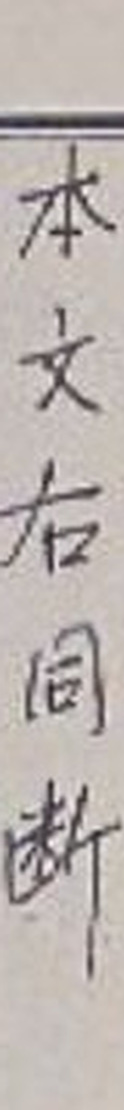本文右同断
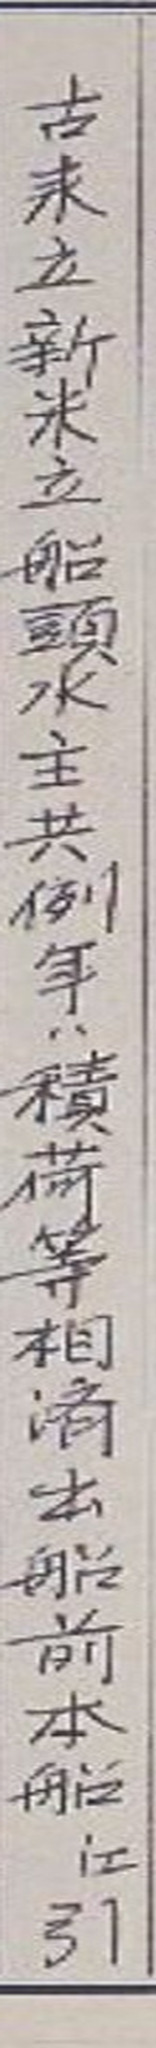古来立新米立船頭水主共例年は積荷等相済出船前本線え引
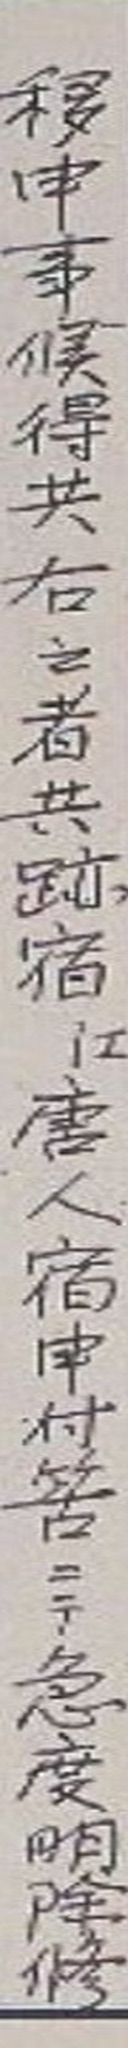移申事候得共右之者共跡宿え唐人宿申付筈にて急度明除修
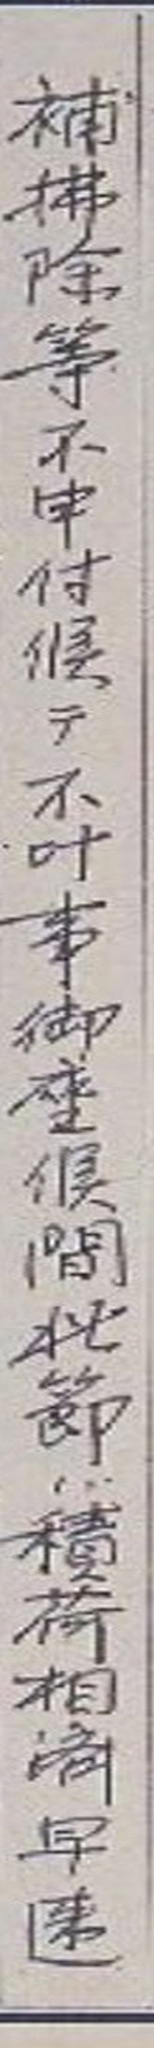補払除等不申付候て不叶事御座候間此節は積荷相済早速
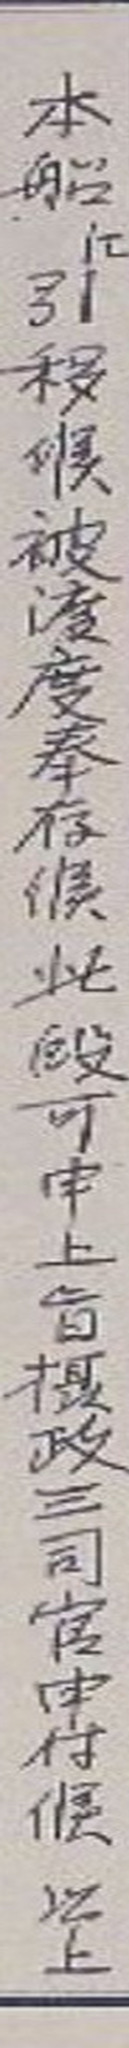本船え引移候被渡度奉存候此段可申上旨摂政三司官申付候以上

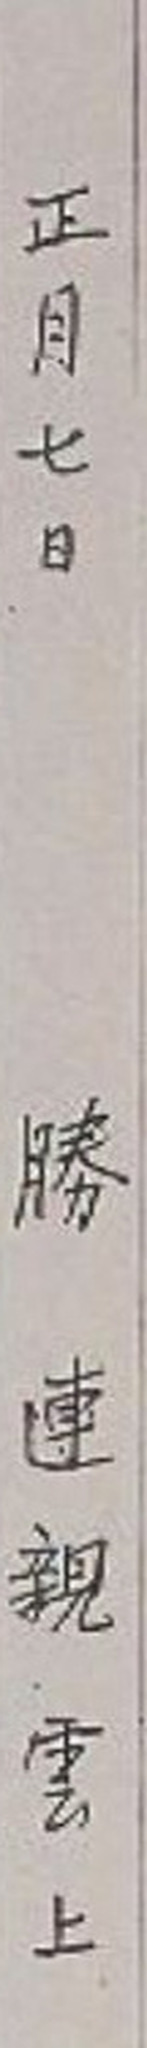正月七日勝連親雲上
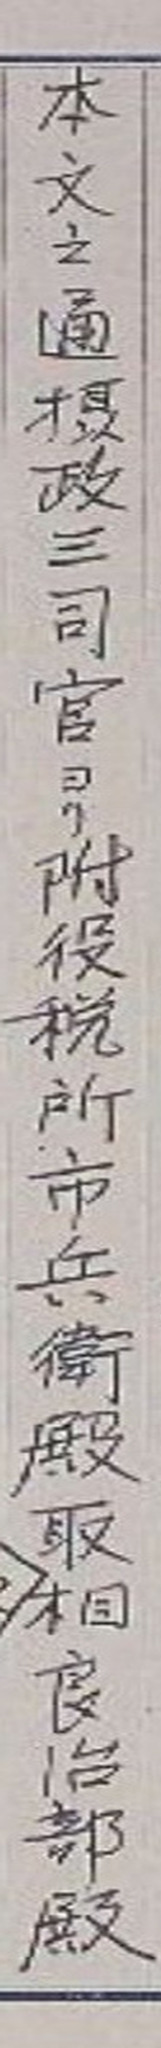本文之通摂政三司官より附役税所市兵衛殿取次相良治部殿
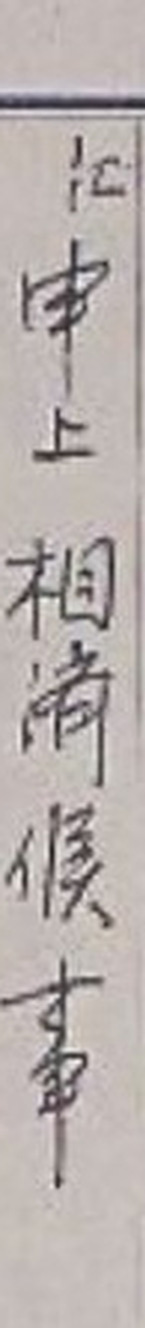え申上相済候事
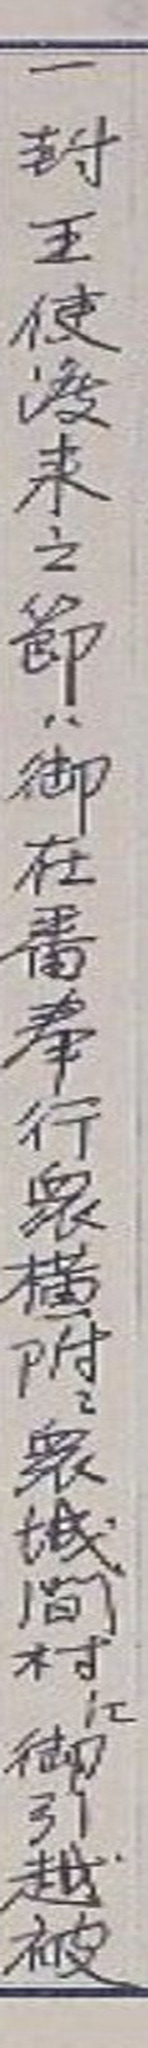一封王使渡来之節は御在番奉行衆横附々衆城間村え御引越被
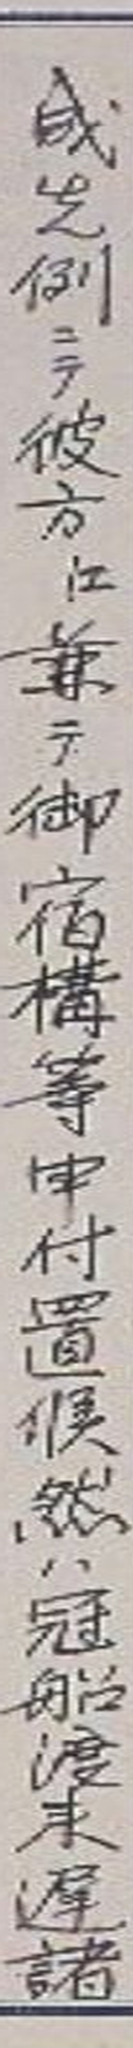成先例にて彼方え兼て御宿構等申付置候然は冠船渡来遅諸
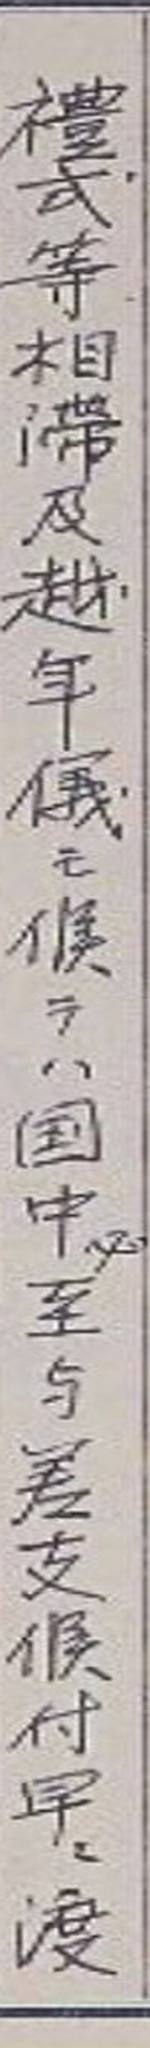礼式等相滞及越年儀も候ては国中必至と差支候付早々渡
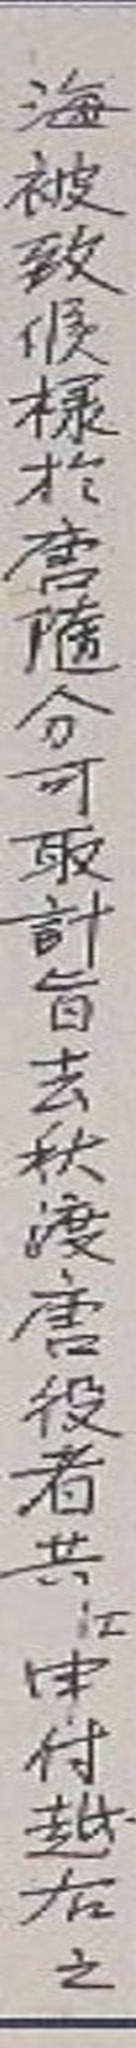海被致候様於唐随分可取計旨去秋渡唐役者共え申付越右之
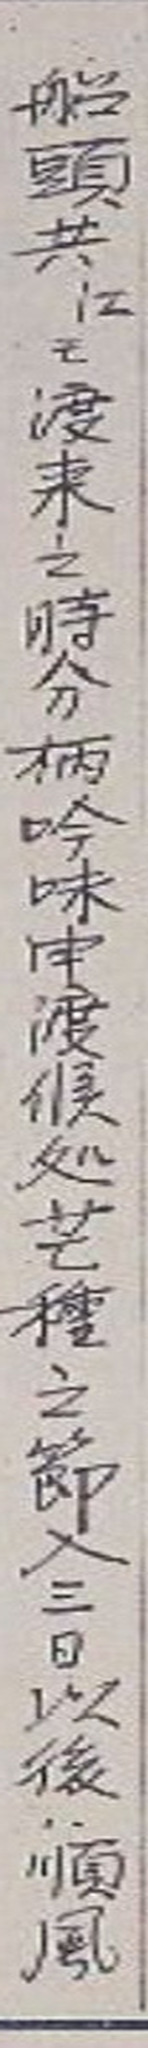船頭共えも渡来之時分柄吟味申渡候処芒種之節入三日以後は順風
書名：支那冊封使来琉諸記 下巻
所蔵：University of the Ryukyus Library
